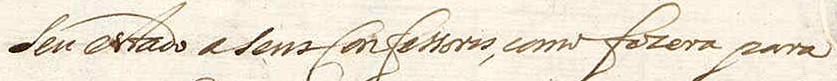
Seu estado a seus Confessores, como fazem para
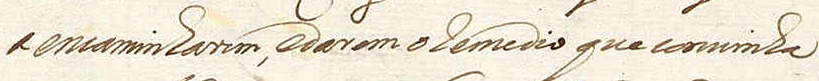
a encaminharem, e darem o Remedio que conuinha
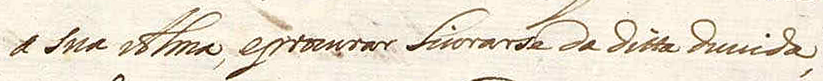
a sua Alma, e procurar Liurarse da ditta duuida,
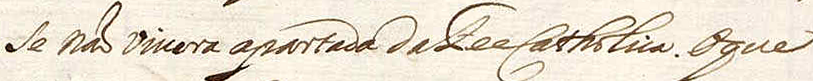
se não viuera apartada da Fee Catholica. O que
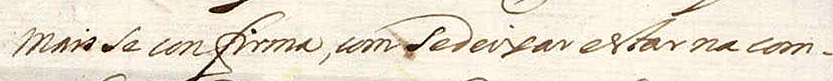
mais se confirma, com se deixar estar na com
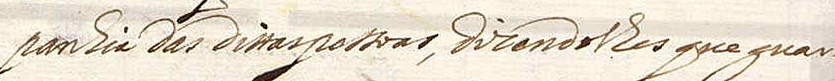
panhia das dittas pessoas, dizendolhes que guar
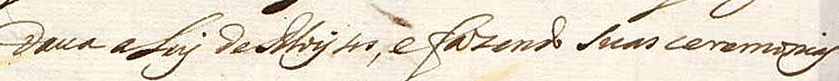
daua a Ley de Moyses, e fazendo suas ceremonias
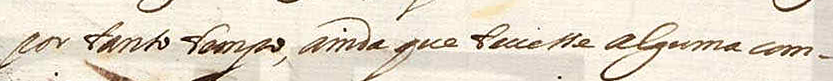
por tanto tempo, ainda que teuesse alguma com
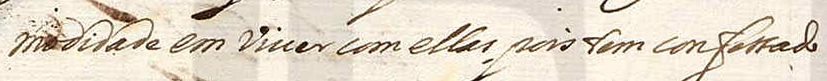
modidade em viuer com ellas, pois tem confessado
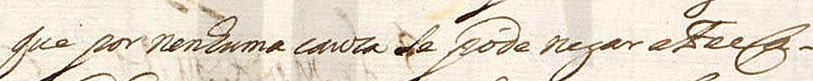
que por nenhuma cauza se pode negar a Fee Ca
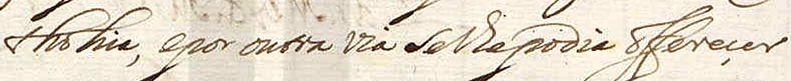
tholica, e por outra via se lhe podia offerecer
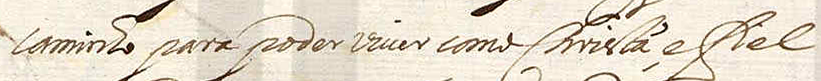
caminho para poder viuer como Christã, e fiel
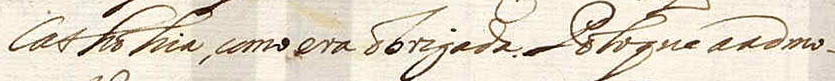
Catholica, como era obrigada. Polo que a admo
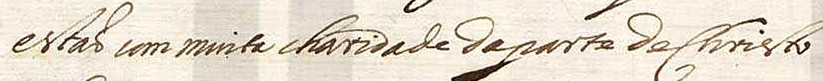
estaõ com muita charidade da parte de Christo
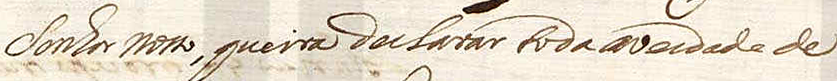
Senhor nosso, queira declarar toda a verdade de
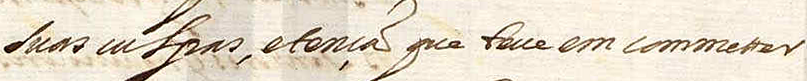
suas culpas, e tenção que teue em commetter
